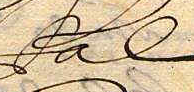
tal
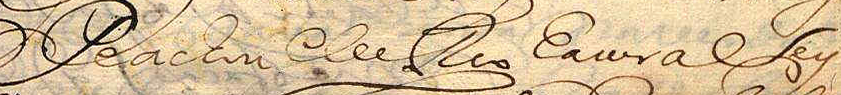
Se achou elle Reo hauera Seis
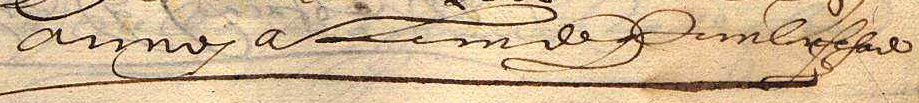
annos aLem do q̄ tem confesado
